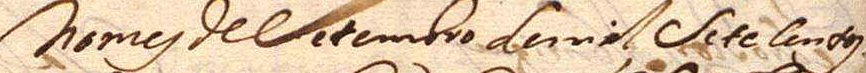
no mes de Setembro de mil, setecentos
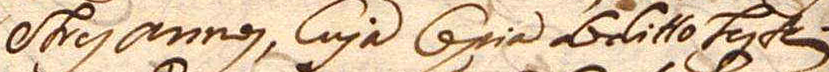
e tres annos, Cuja Copia do ditto Teste
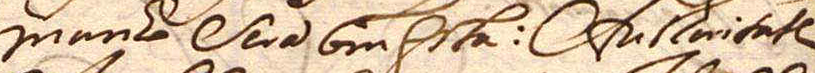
munho sera composta: Authoritate
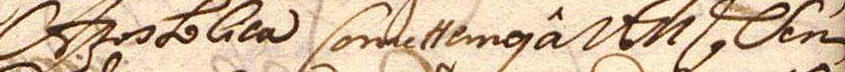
Apostolica Comettemos â VM q̄ sen
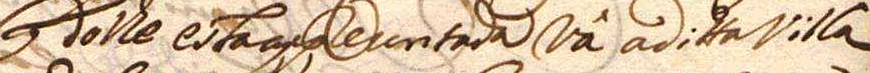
dolhe esta apprezentada vâ a ditta Villa
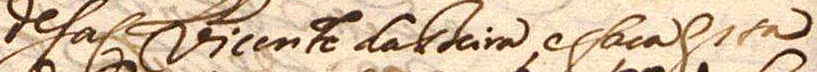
de sā Vicente da Beira, e faça esta
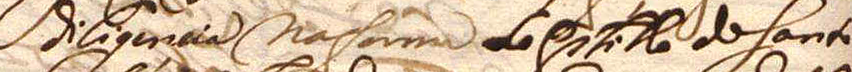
diligençia na forma do estillo do santo
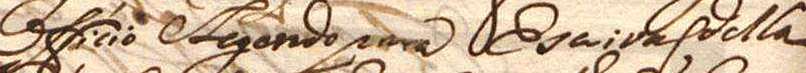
offiçio eLegendo para Escrivā della
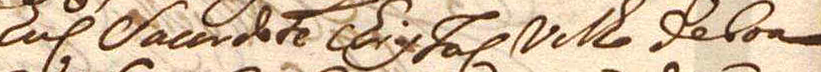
hū sacerdote cristā velho de boa
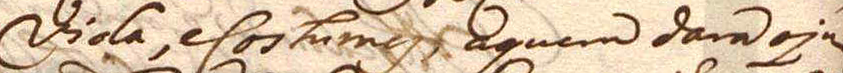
vida, e Costumes, a quem dara o ju
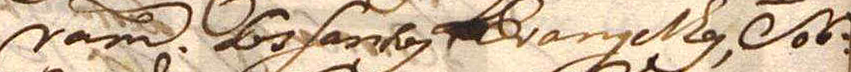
ram.to dos santos Evangelhos, sob
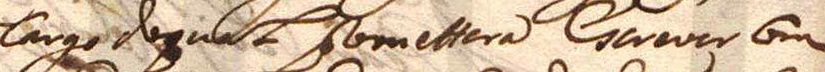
Cargo do qual promettera Escrever Com
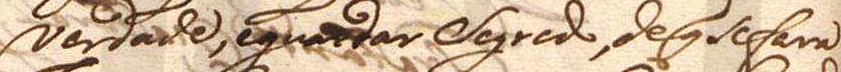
verdade, e guardar segredo, de q̄ se fara
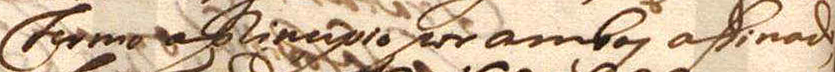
termo a prinçipio por ambos assinado,
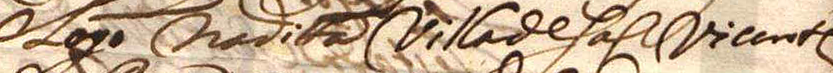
e Logo na ditta Villa de sā Vicente
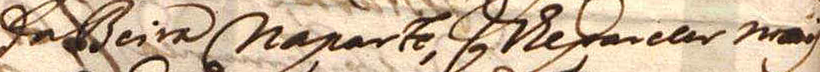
da Beira na parte, q̄ lhe parecer mais
